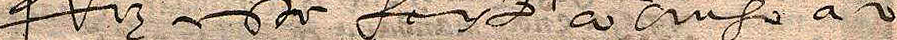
ffiz este feyto c̄ocruso ao
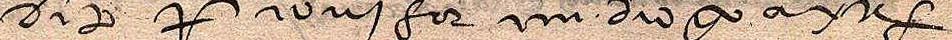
dito proujsor eeu. diogo ayres
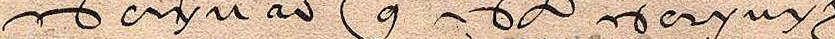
escryuão q̄ esto escryuy
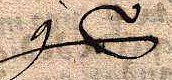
ꝯo
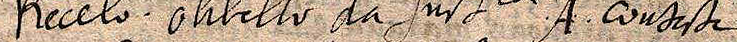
Recebo . o libello da Justca .A. conteste
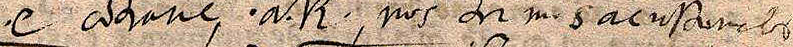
e cōtrarie a .R. nos termos acustomados
